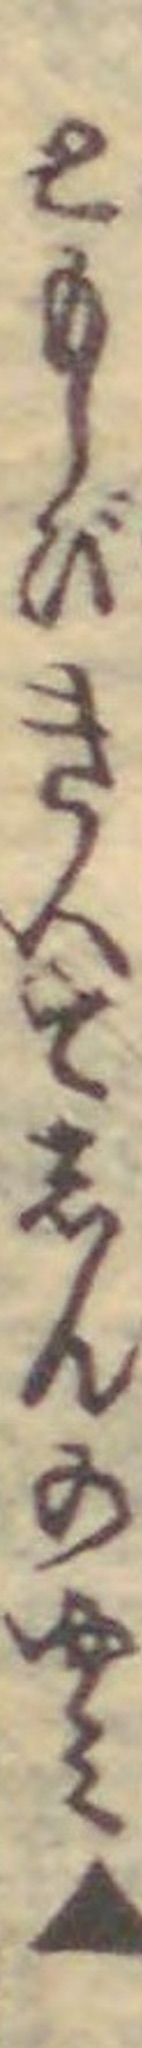ともしびきへてしんのやみ▲

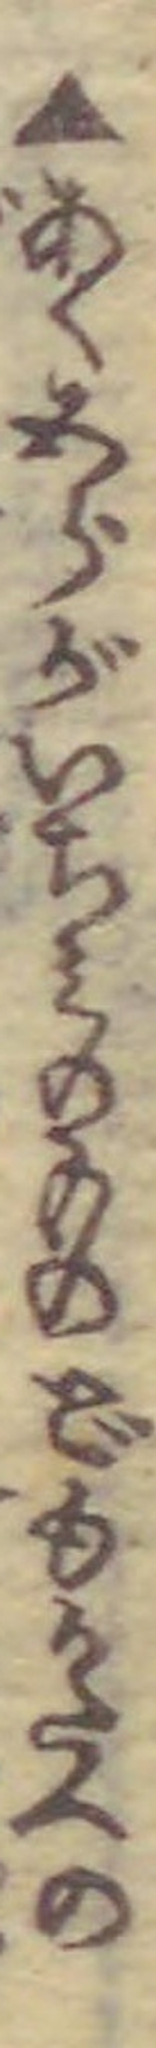▲あく五郎がいちみのものどもかたへの
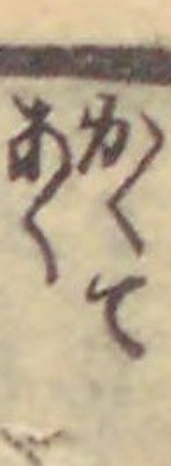かくて
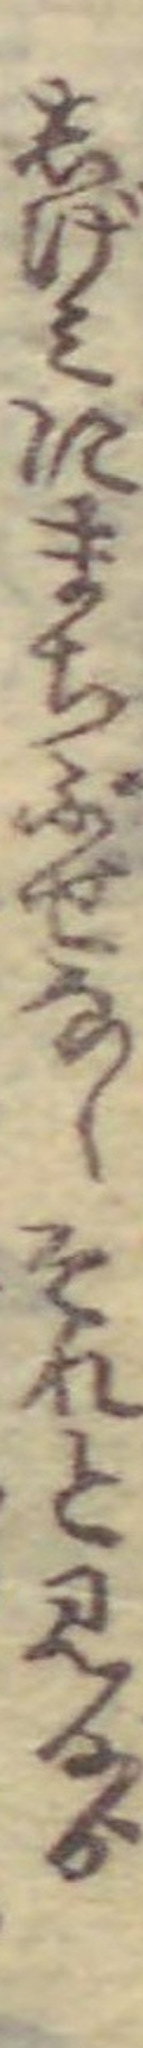しげみにまちぶせなしそれと見るより
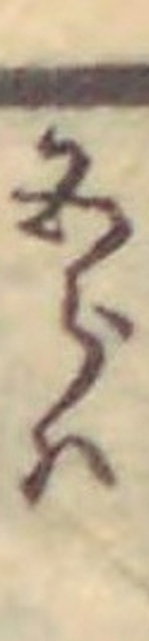五郎は
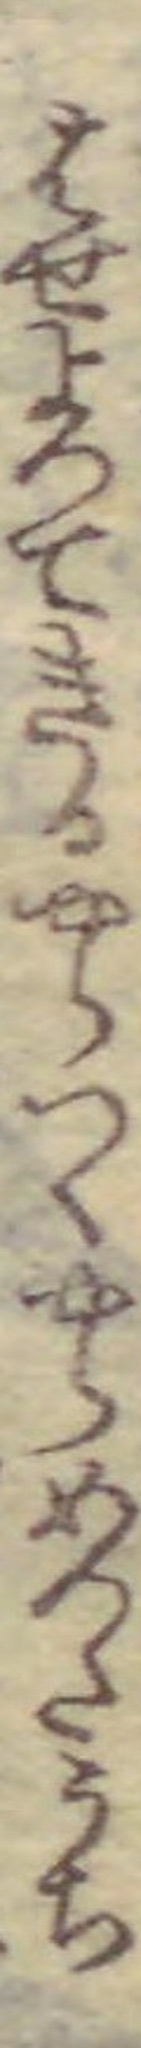はせよつてきるやらつくやらめつたうち
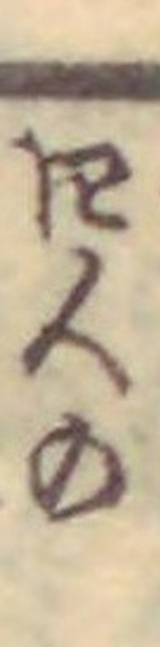四人の
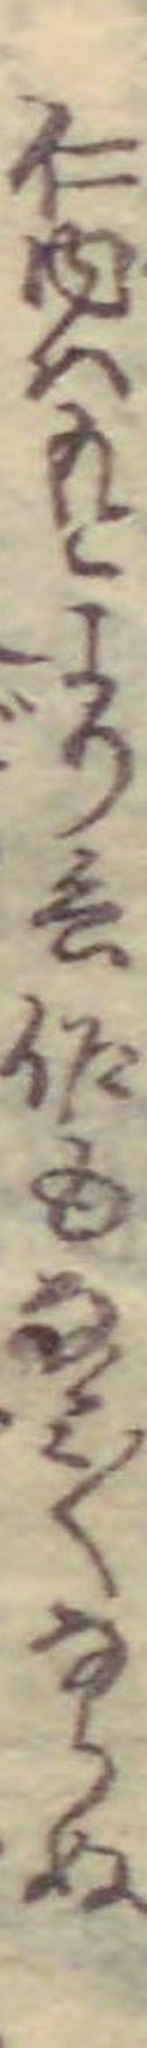仁内はもとより兵作もなみ〳〵ならぬ
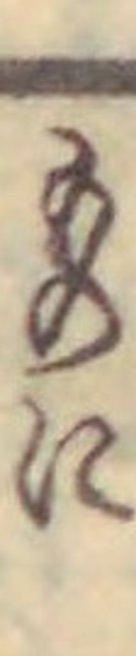ものに
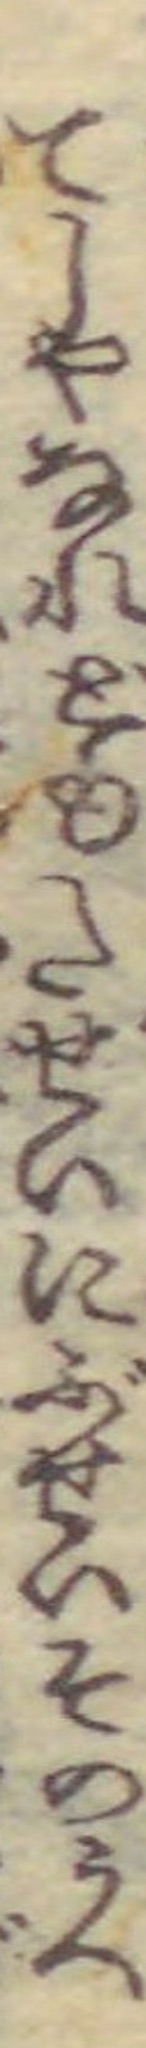てしやなれどもたせいにぶせいそのうへ
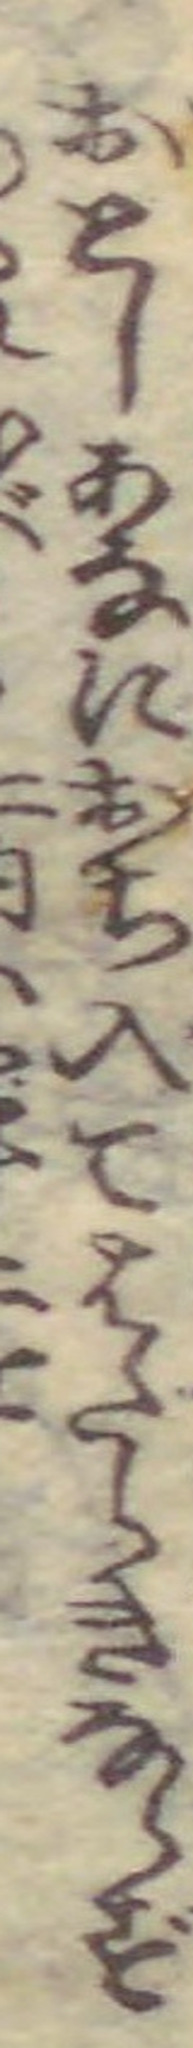おとしあなにおち入てはたらきならず
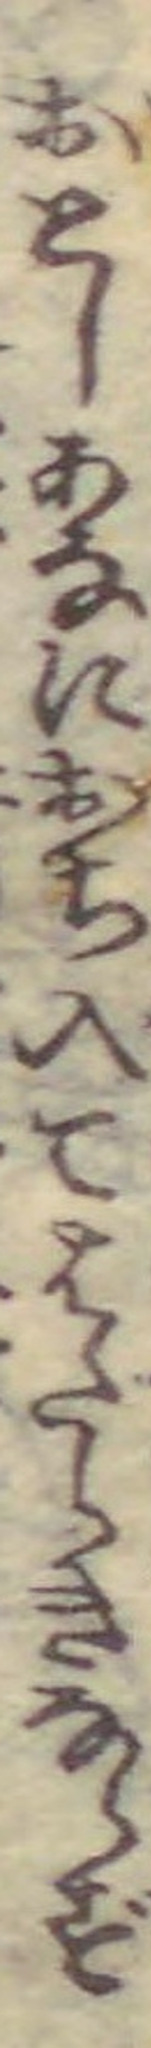おとしあなにおち入てはたらきならず
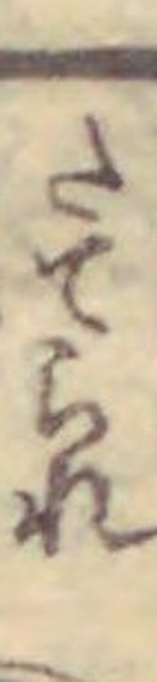たてられ
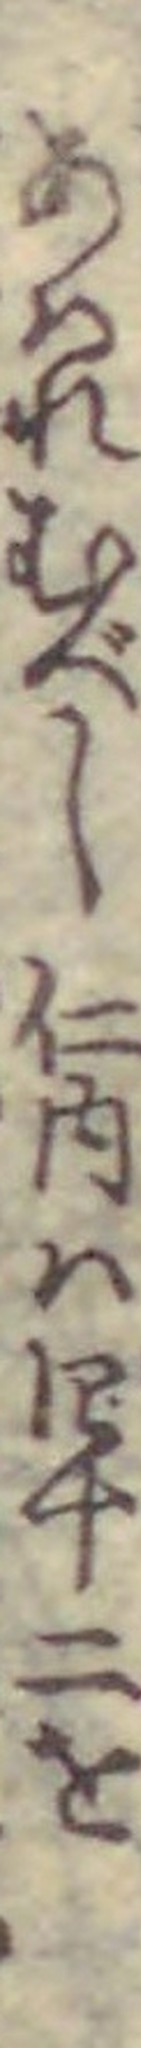あはれむべし仁内は四十二を
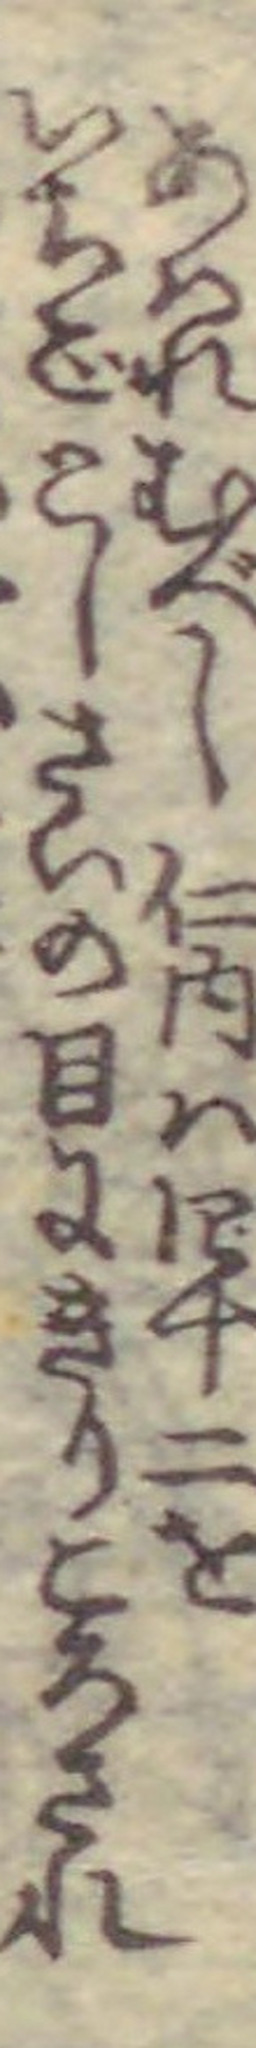いちごとしさいの目にきりころされ
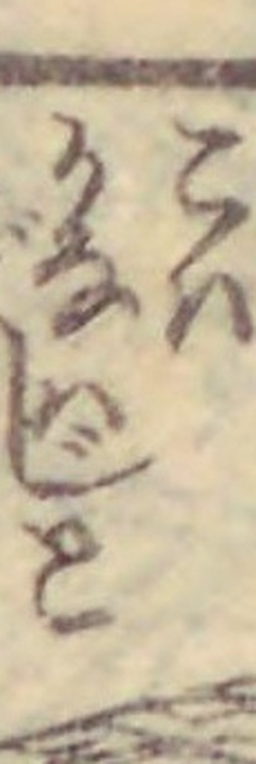かなはじと
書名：八ツ目鱣因縁物語 3巻
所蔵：国立国会図書館 National Diet Library, JAPAN
